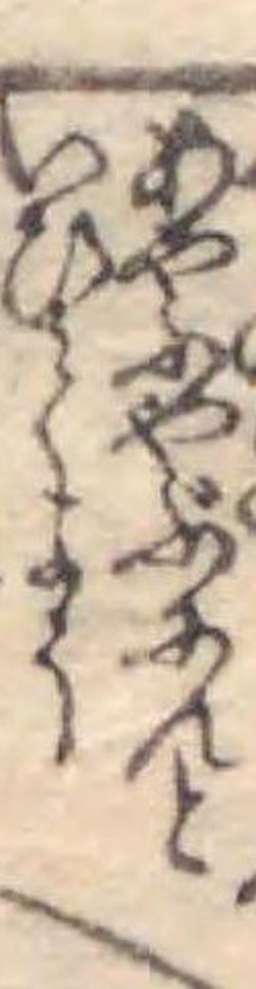いひてよう
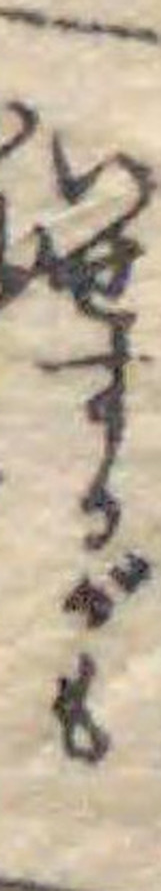いせするがも
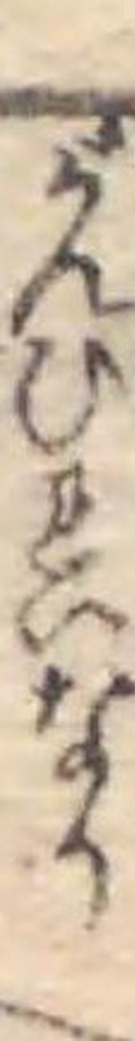がんひれいなり
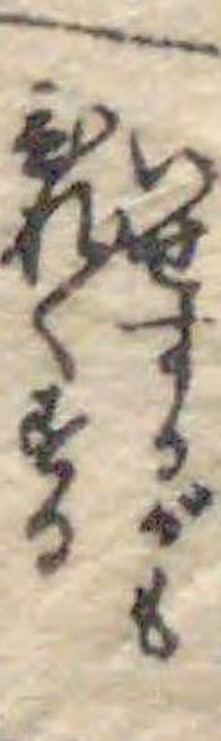ひれ〳〵する
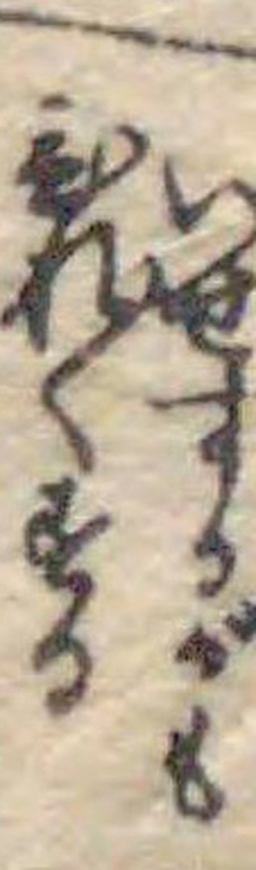ひれ〳〵する
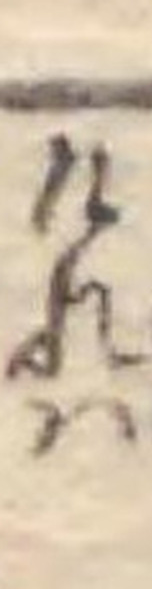けれは
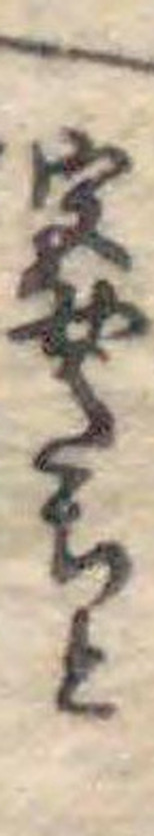宮女たちと
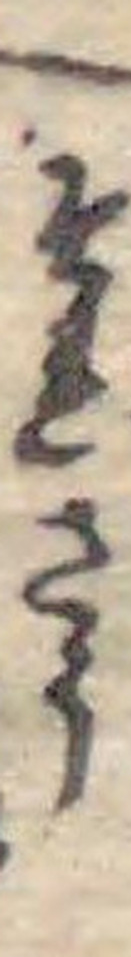それさう
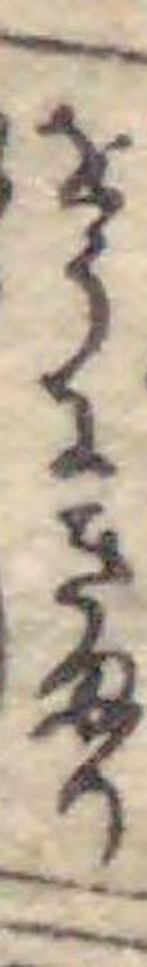をうにきまり
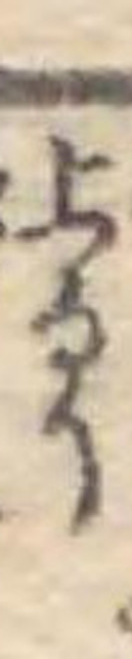上るり
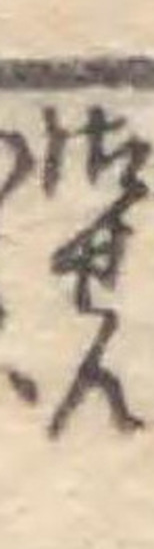御せん
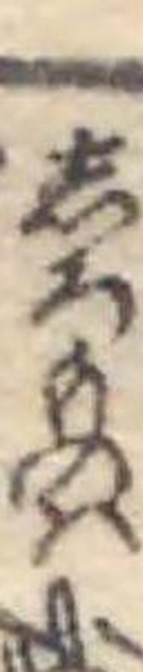しろものは
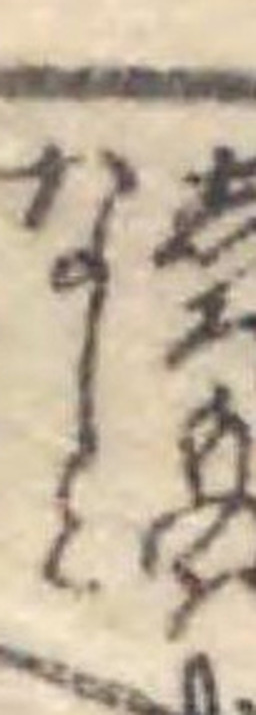なしと
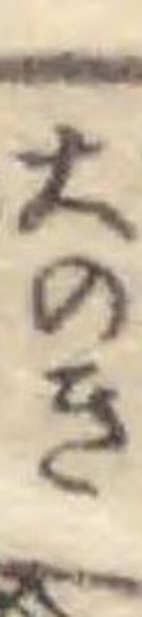大のき
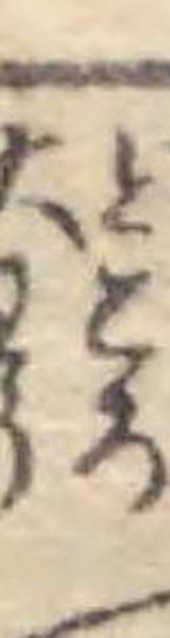大わう
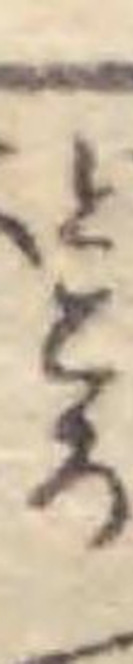ところ
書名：悦贔負蝦夷押領 : 3巻
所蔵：国立国会図書館 National Diet Library, JAPAN
